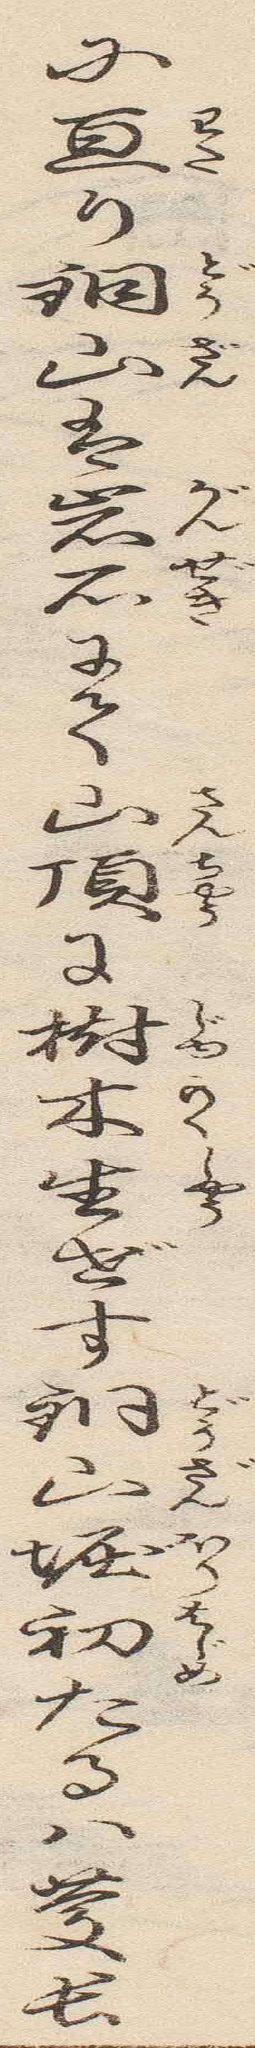に亘り銅山は岩石にて山頂に樹木生ぜす銅山堀初たるは慶長
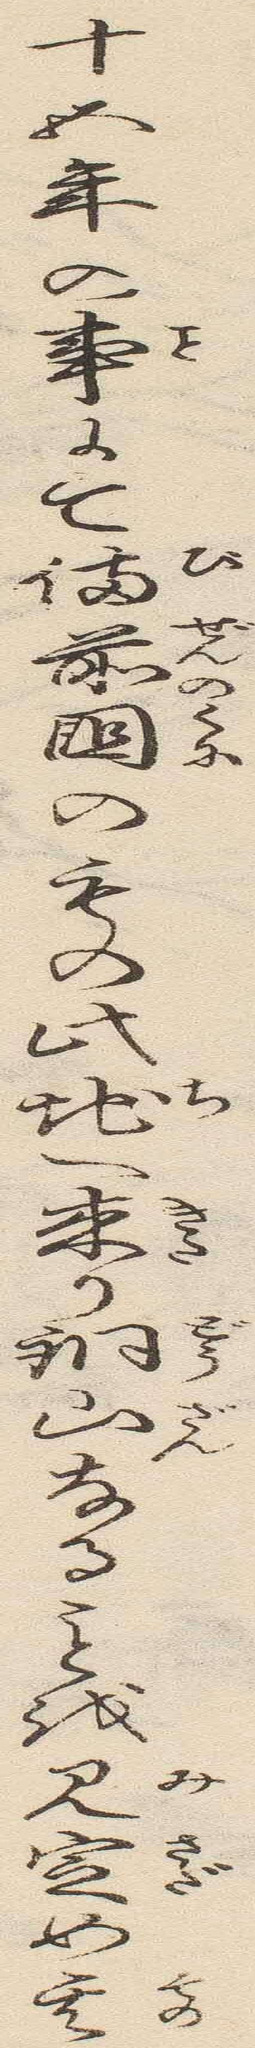十五年の事にて備前國のもの此地へ來り銅山なることを見定め其
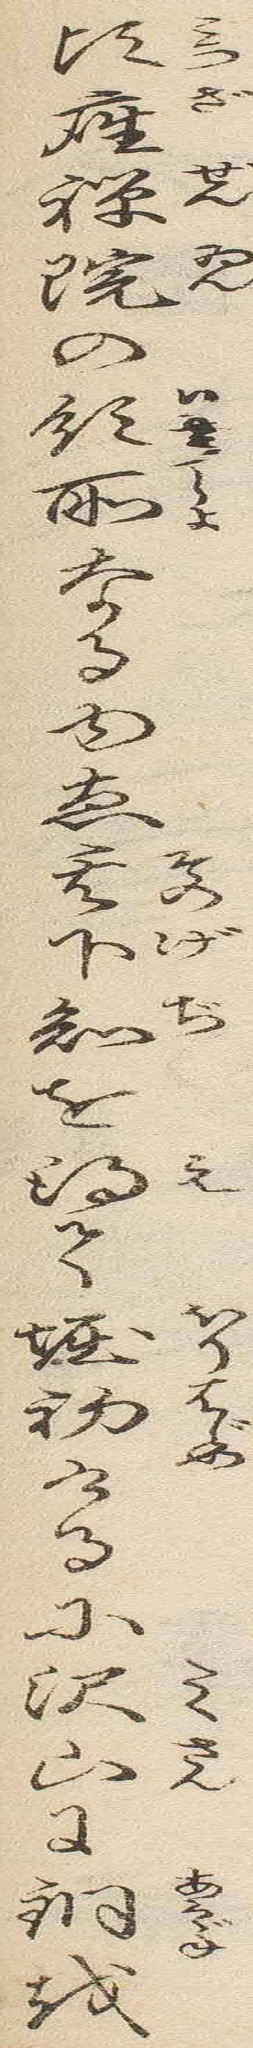頃座禅院の領所なるゆゑ其下知を得て堀初けるに沢山に銅を
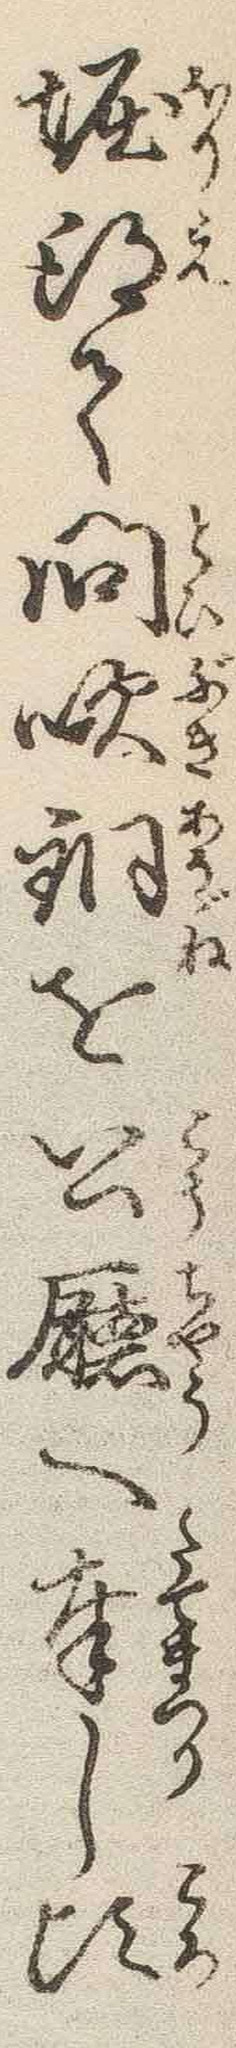堀得て問吹銅を公廳へ奉し頃
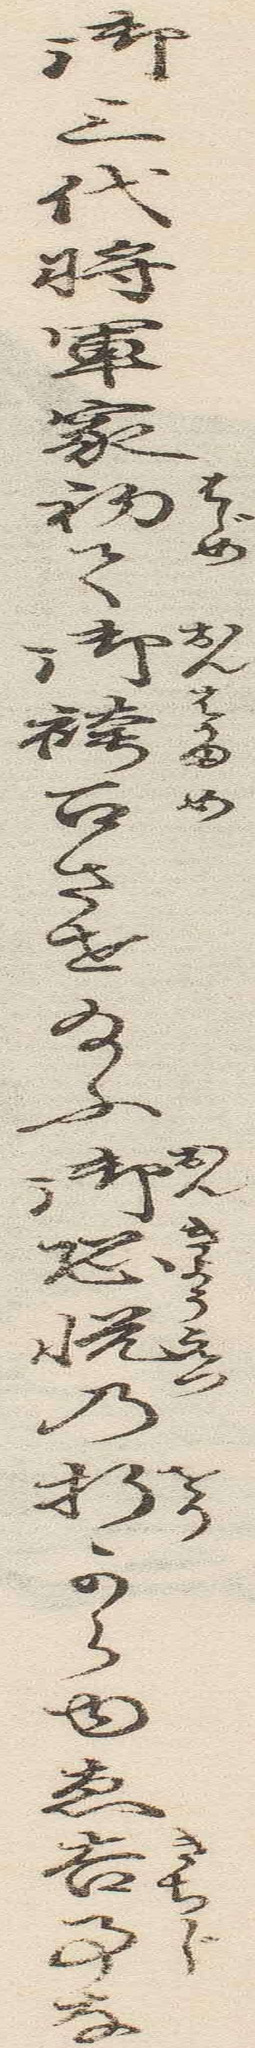御三代將軍家初て御袴召させ給ふ御恐悦の折からゆゑ吉事な
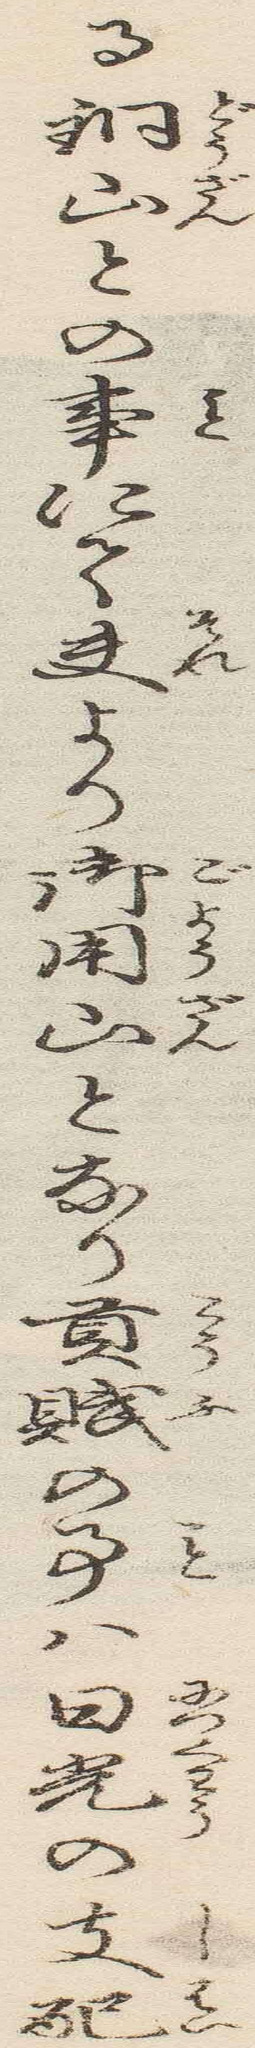る銅山との事にて夫より御用山となり貢賦の事は日光の支配
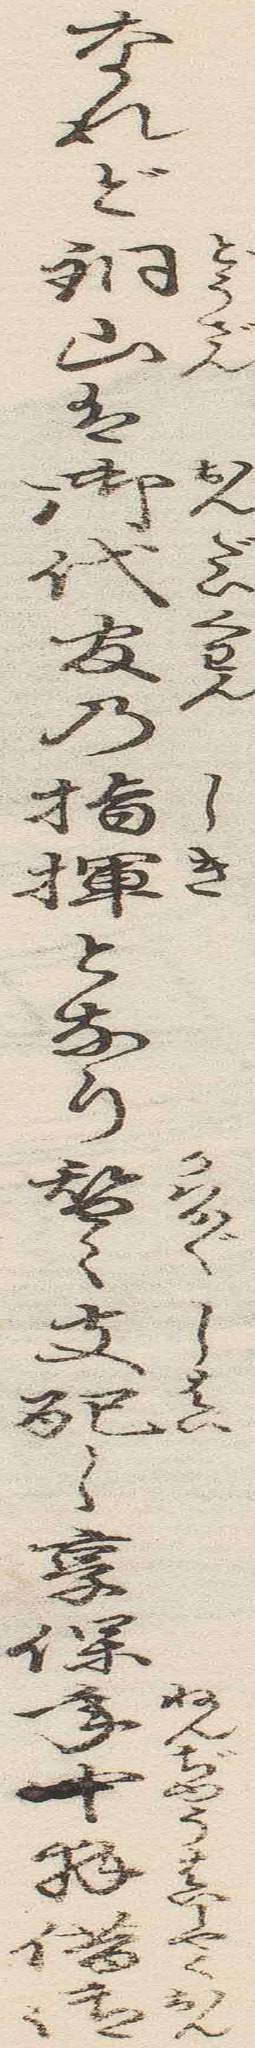なれど銅山は御代官の指揮となり替〻支配し享保年中拝借御
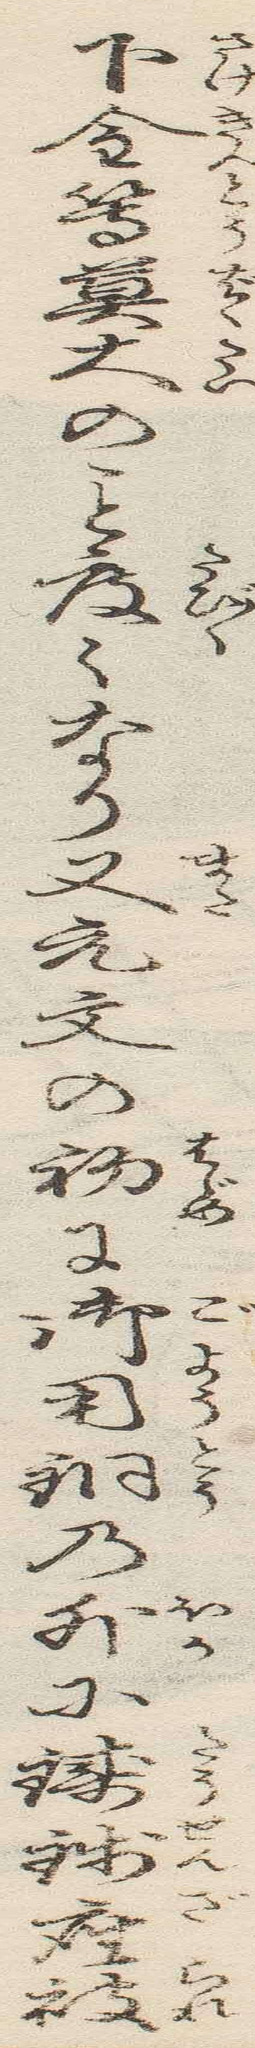下金等莫大のこと度〻なり又元文の初に御用銅の外に鋳銭座被
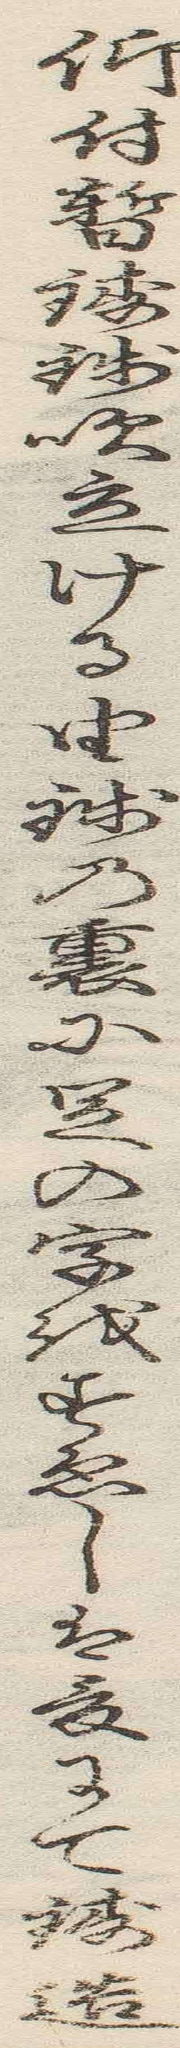仰付暫鋳銭吹立ける由銭の裏に足の字をすゑしは爰にて鋳造
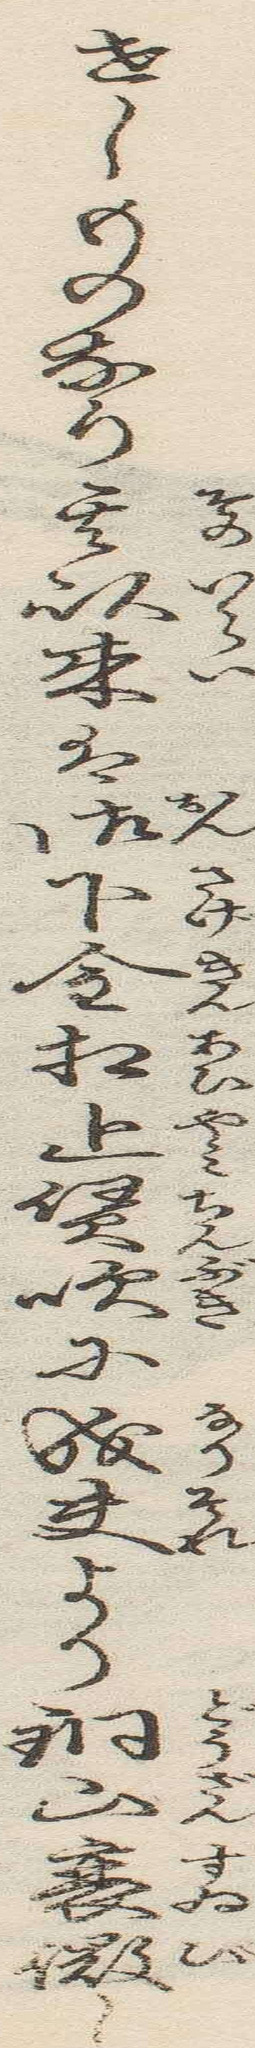せしものなり其以來は御下金相止賃吹に成夫より銅山衰微し
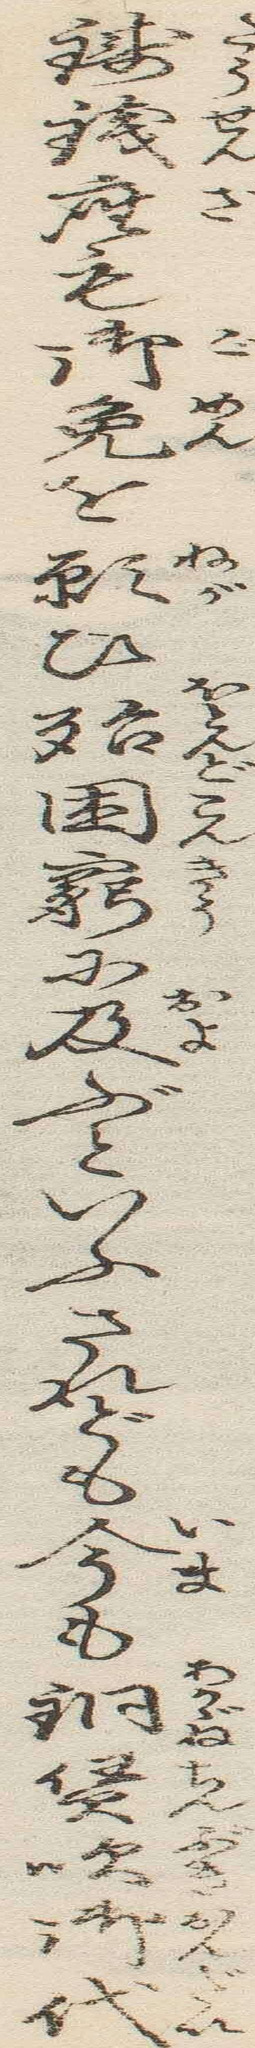鋳銭座も御免を願ひ殆困窮に及ぶといふされども今も銅賃吹御代
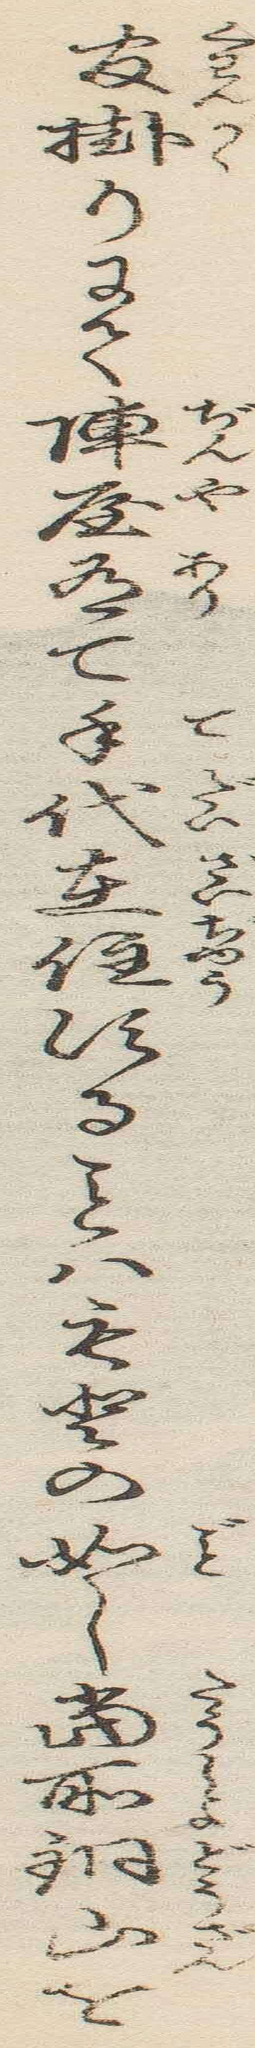官掛りにて陣屋有て手代在住することはもとの如し當所銅山を
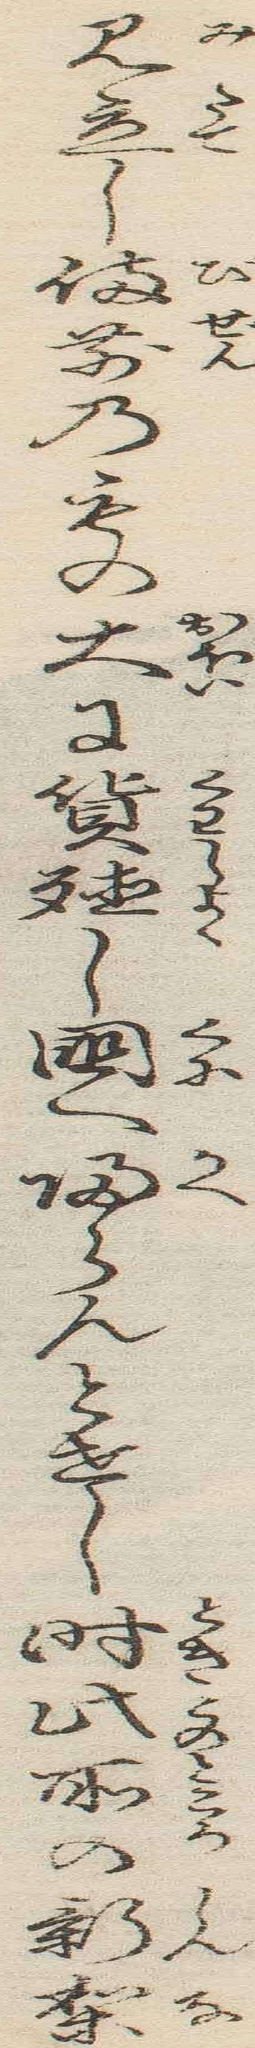見立し備前のもの大に貨殖し國へ帰らんとせし时此所の新梨
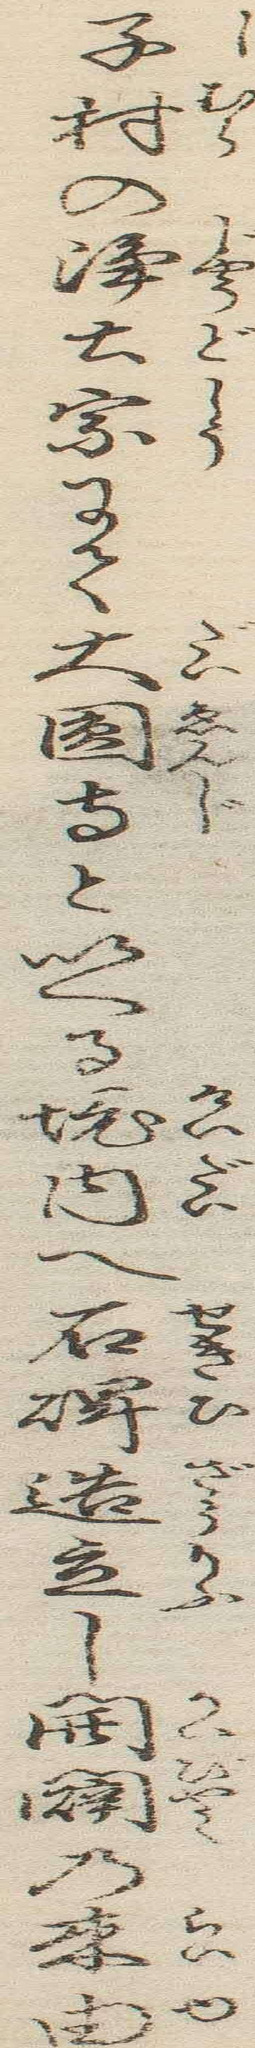子村の浄土宗にて大圓寺といへる境内へ石碑造立し開闢の來由
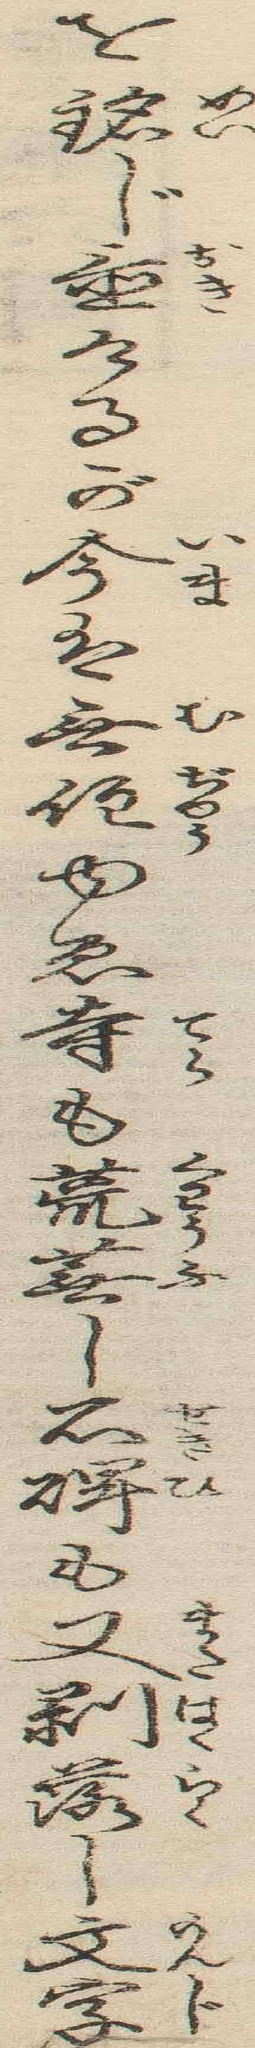を銘じ置けるが今は無住ゆゑ寺も荒蕪し石碑も又剥落し文字

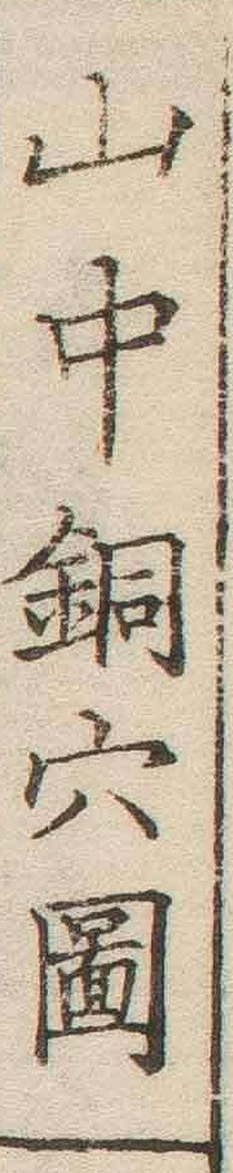山中銅穴圖
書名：日光山志
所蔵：東京学芸大学附属図書館 国文学研究資料館
